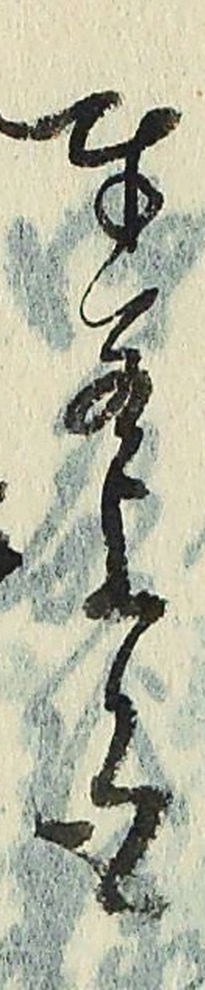奉差上候以上
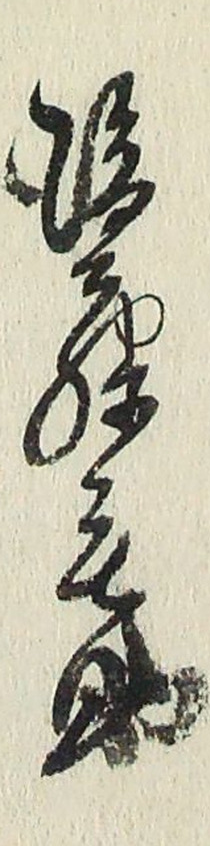後藤庄助
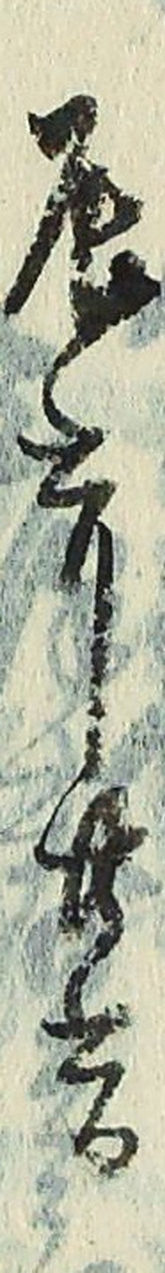辰六月廿六日
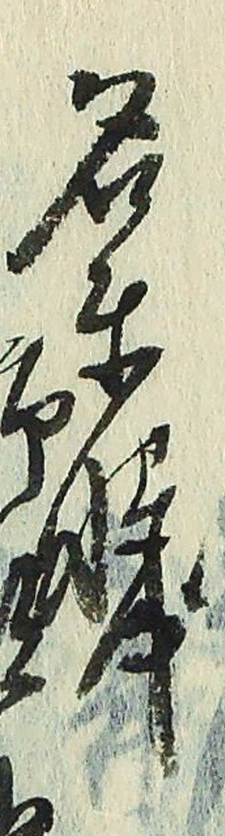名東勝浦
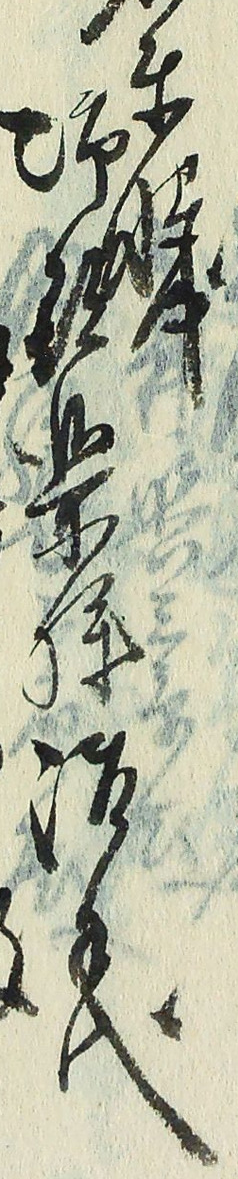御郡代様御手代
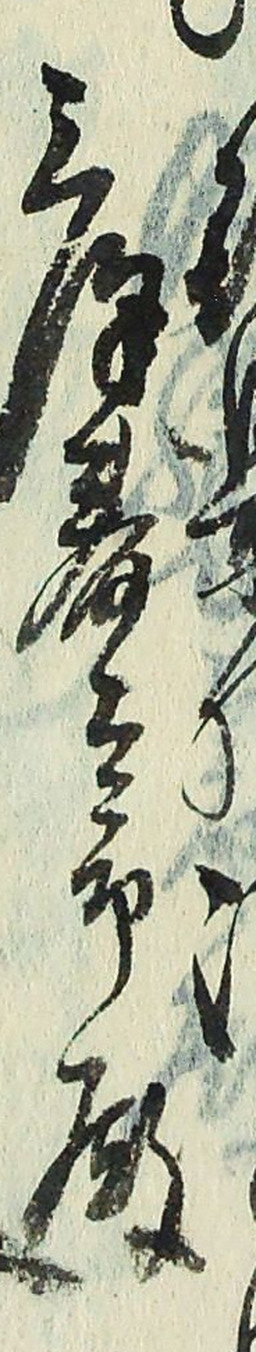三沢春太郎殿
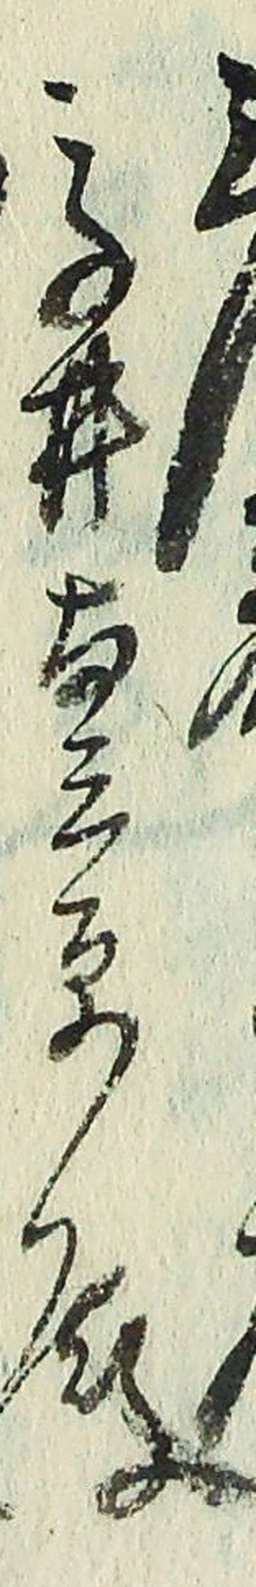高井与三兵衛殿
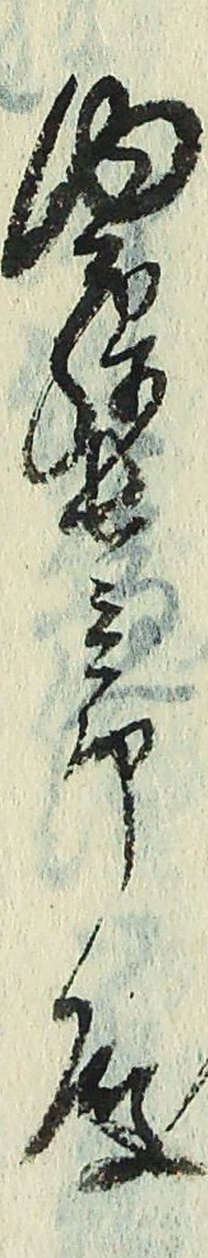内藤長三郎殿
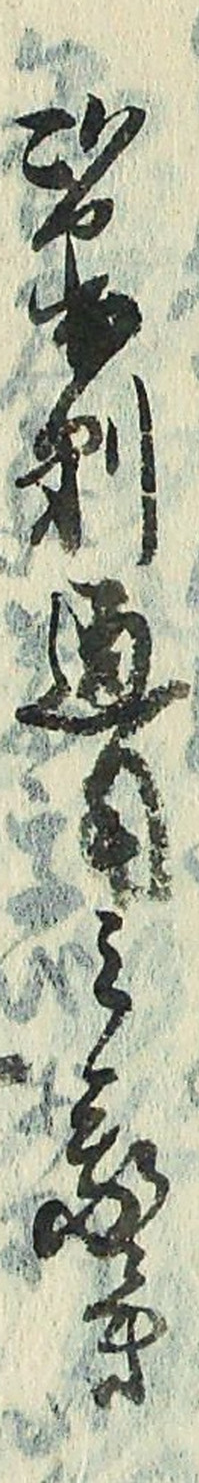弐歩判通用之義に付
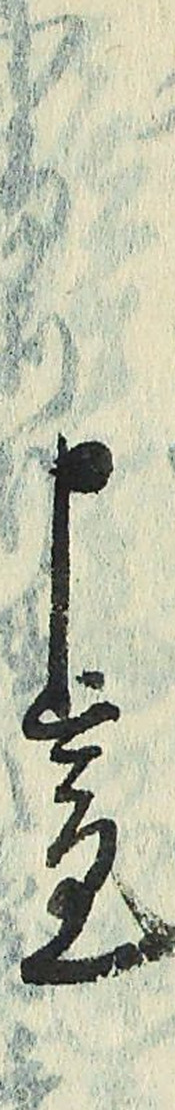申上覚
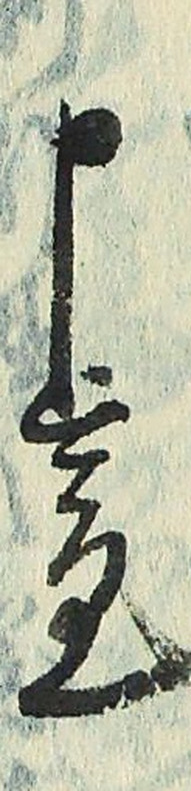申上覚
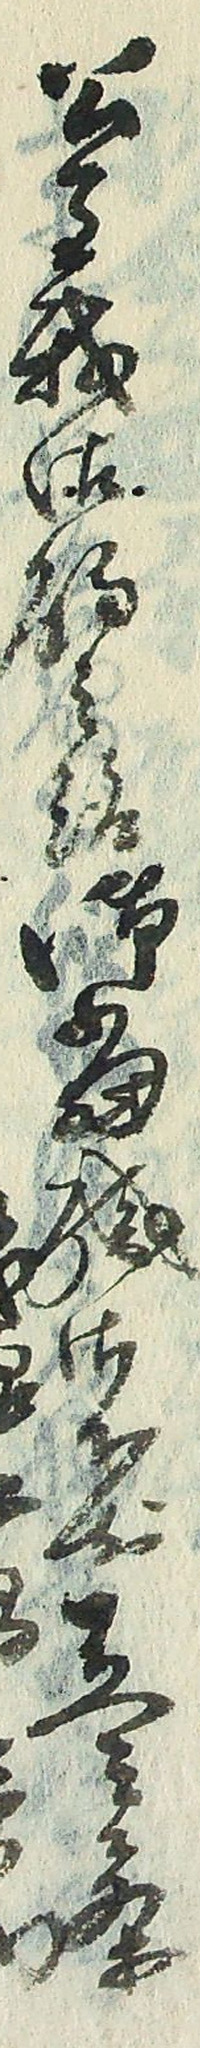公義御触之趣御当職御下知有之候条
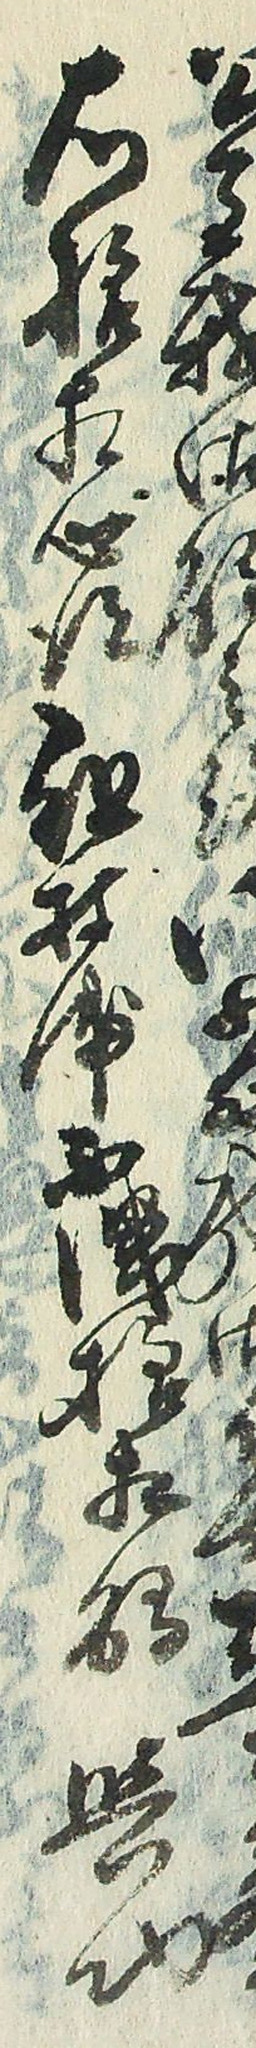右様相心得組村浦不洩様相触与切

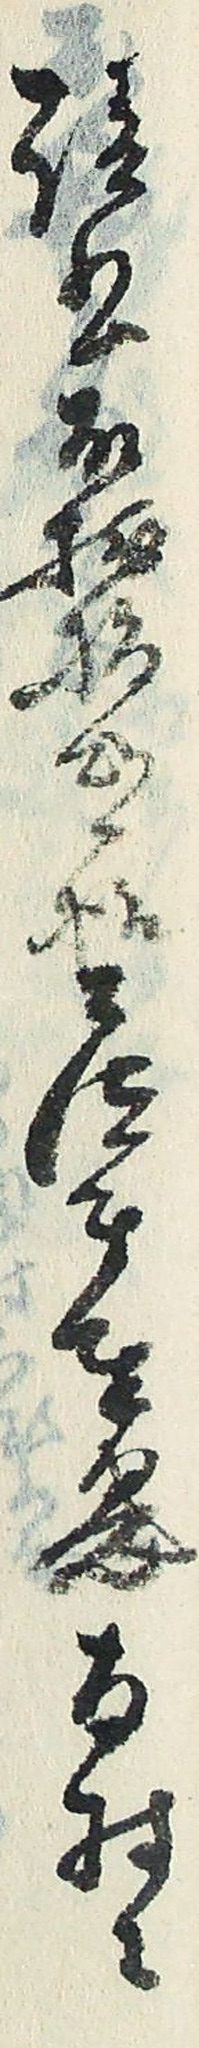請書取揃指出候様被仰付奉畏与村々
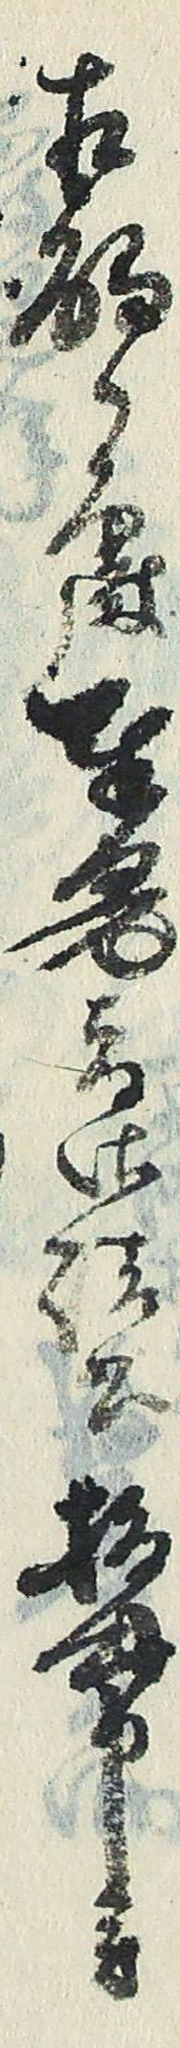相触候処奉畏旨御請書指出申に付
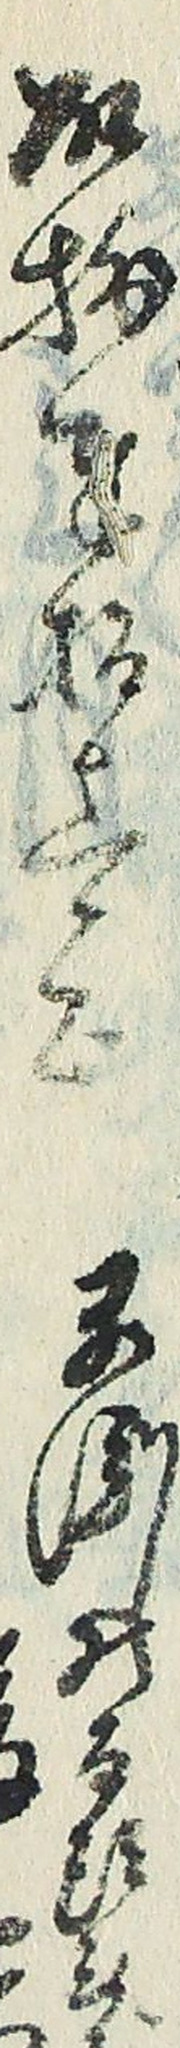取揃奉指上候以上早淵村与頭庄屋
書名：諸御用御□受書控
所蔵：鳴門教育大学 Naruto University of Education
